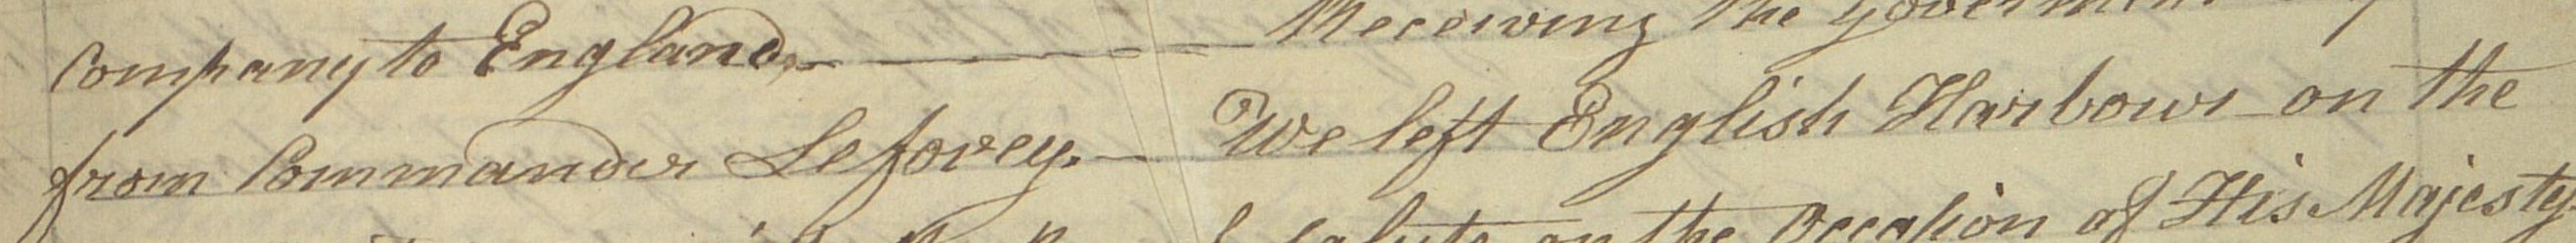from Commander Lefovey. We left English Harbour on the
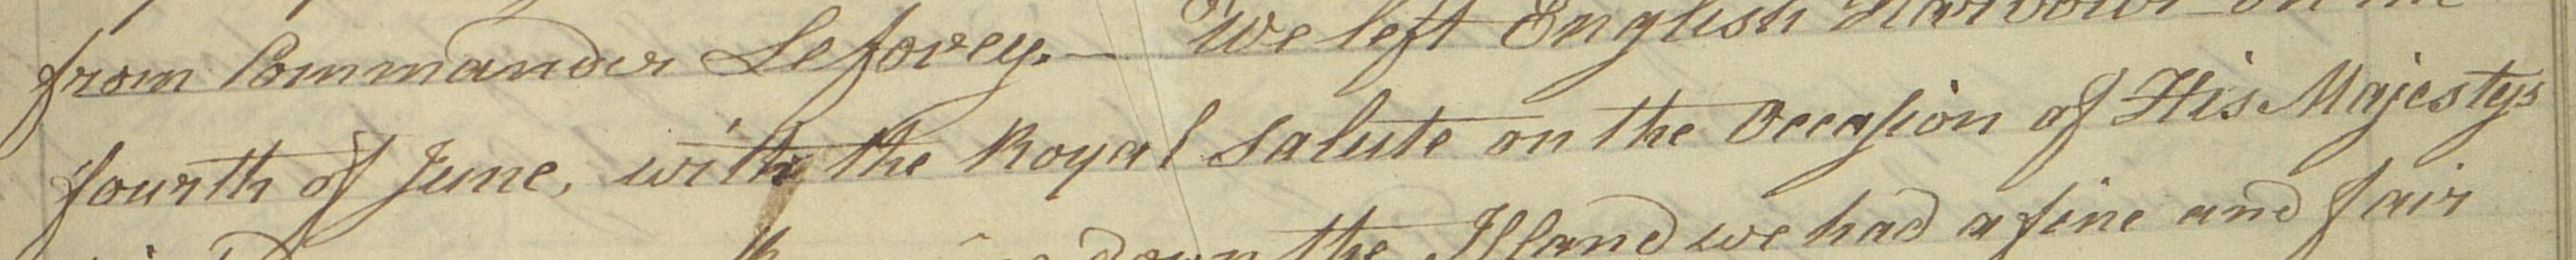fourth of June, with the Royal salute on the Occasion of His Majestys
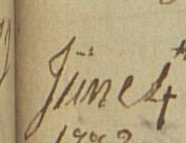June 4^th
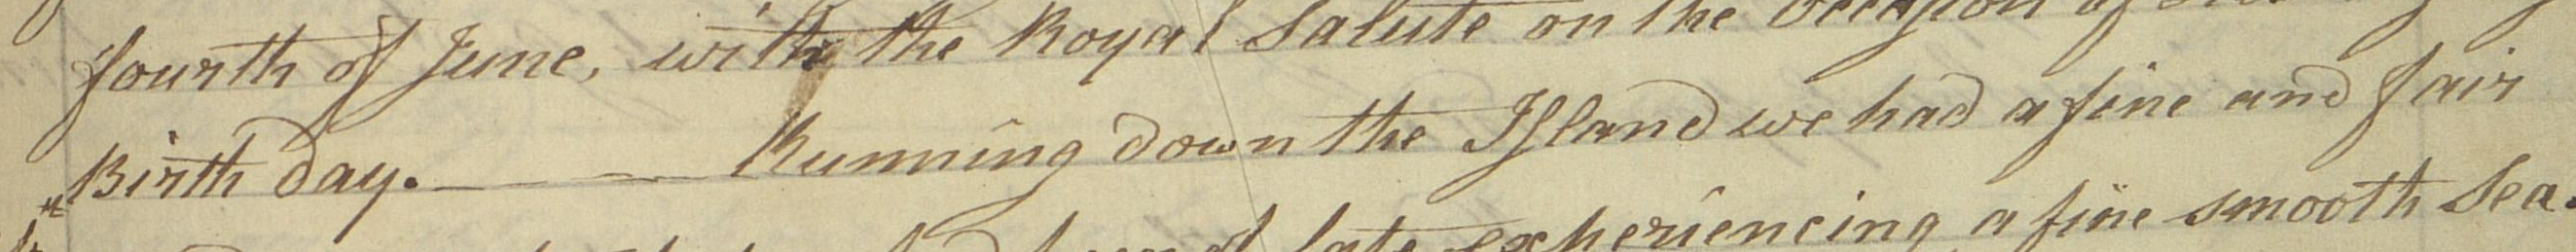Birth day. Running down the Island we had a fine and fair
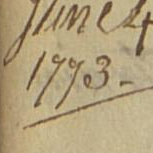1773
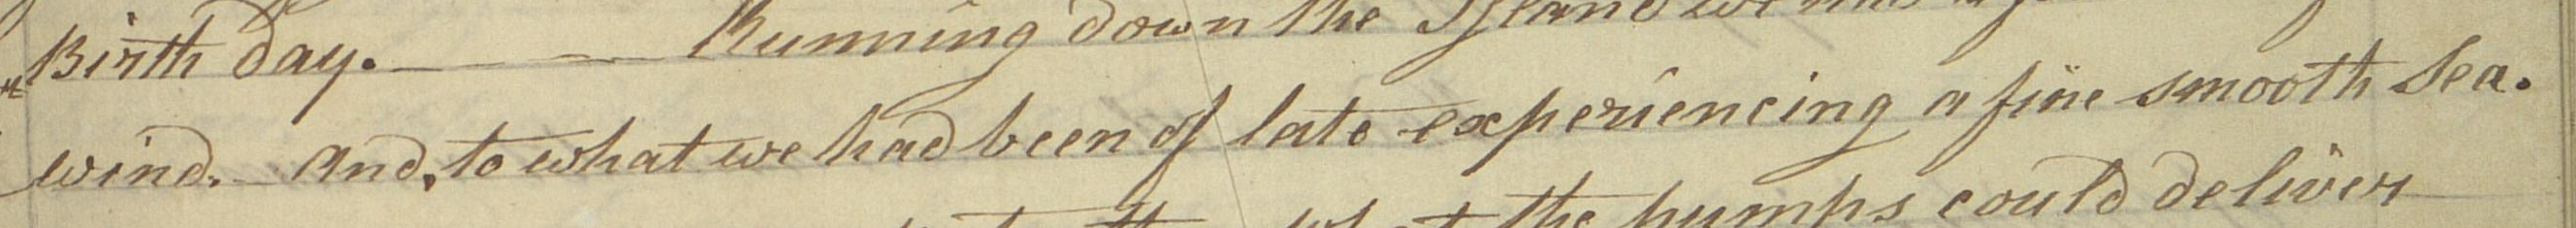wind. And, to what we had been of late experiencing a fine smooth Sea.
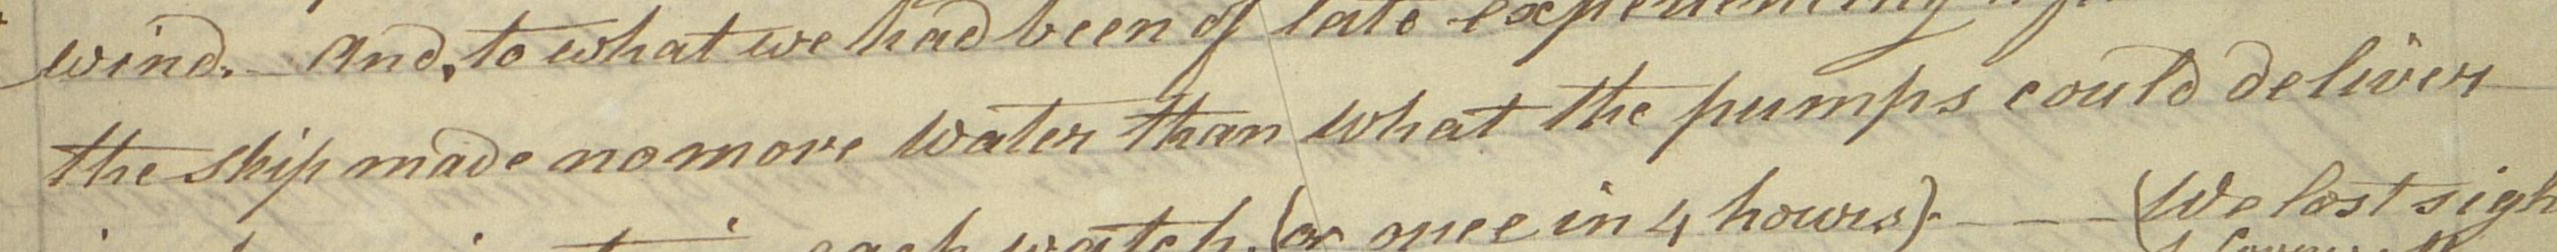the ship made no more Water than what the pumps could deliver
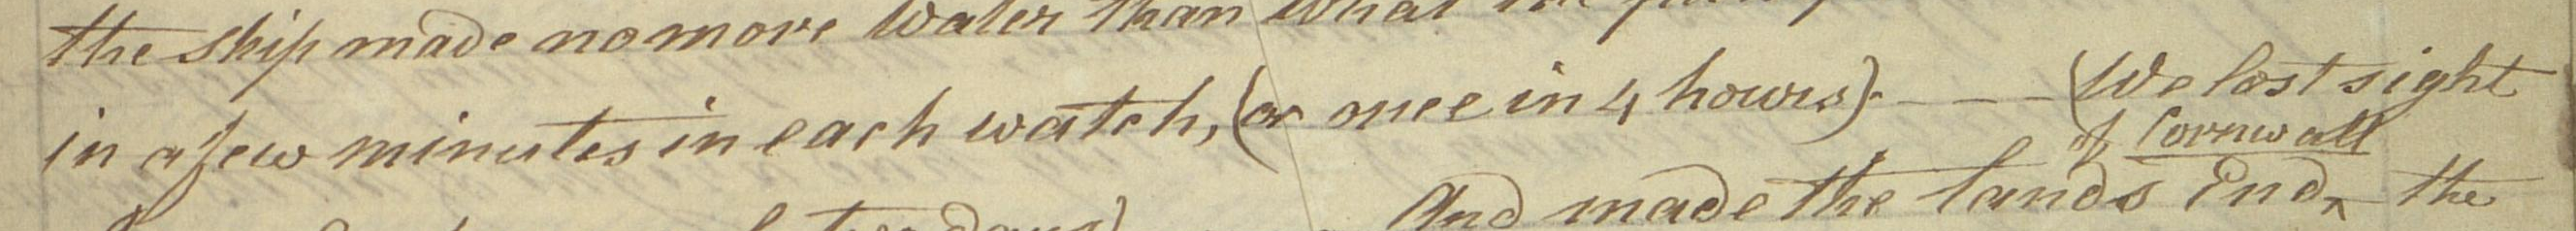in a few minutes in each watch, (or once in 4 hours) (We lost sight
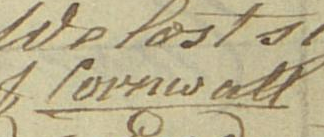Cornwall
